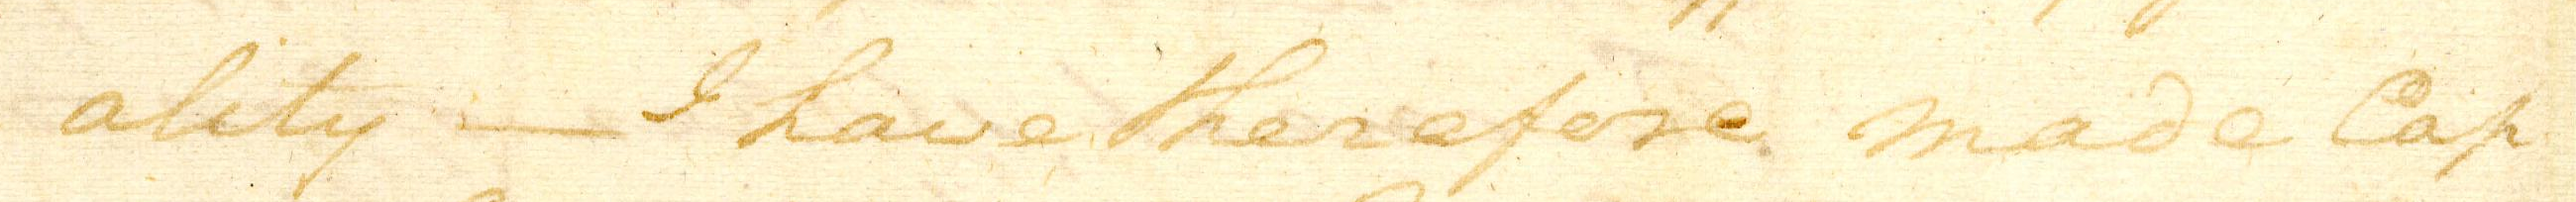ality- I have therefore made Cap
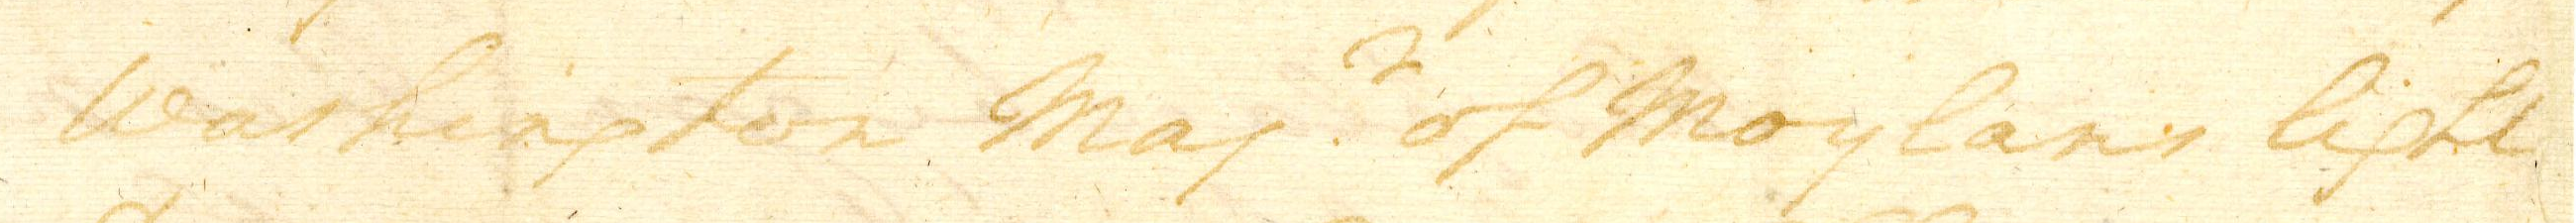Washington Maj^r. of Moylans light
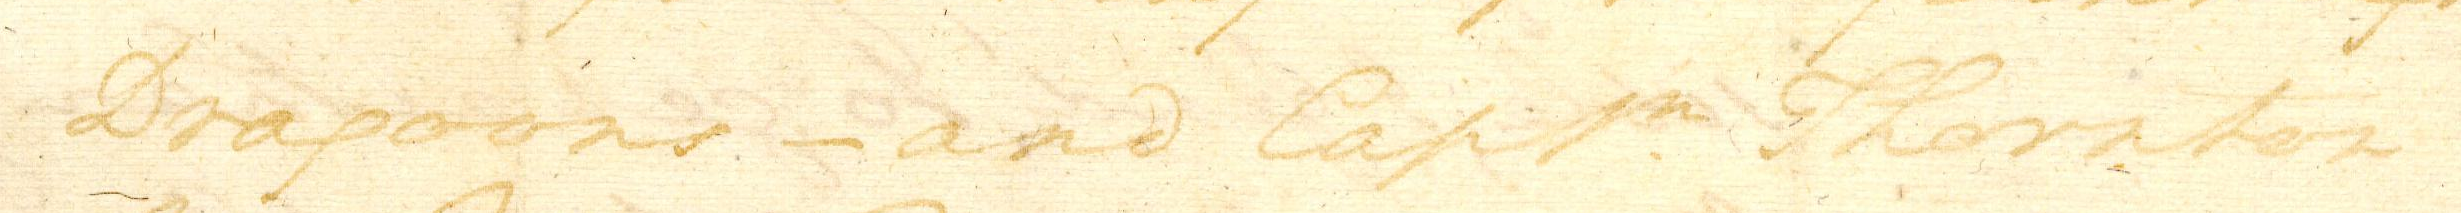Dragoons- and Capt^n. Thornton
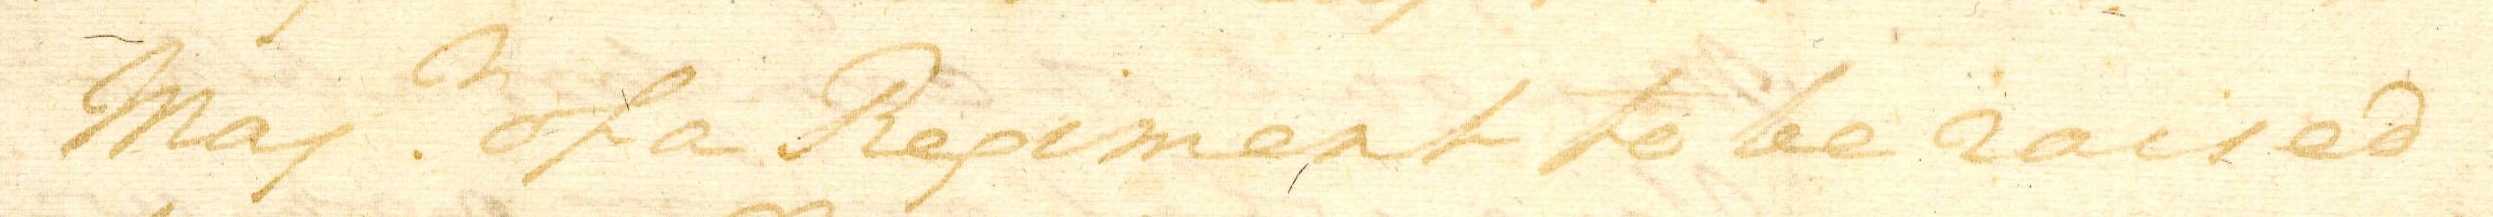Maj^r. of a Regiment to be raised
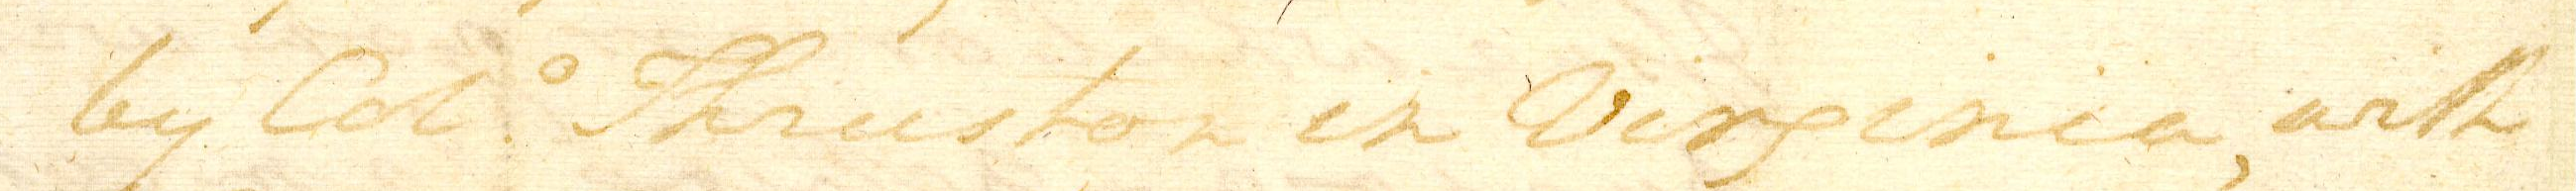by Col^o. Thruston in Virginia, with
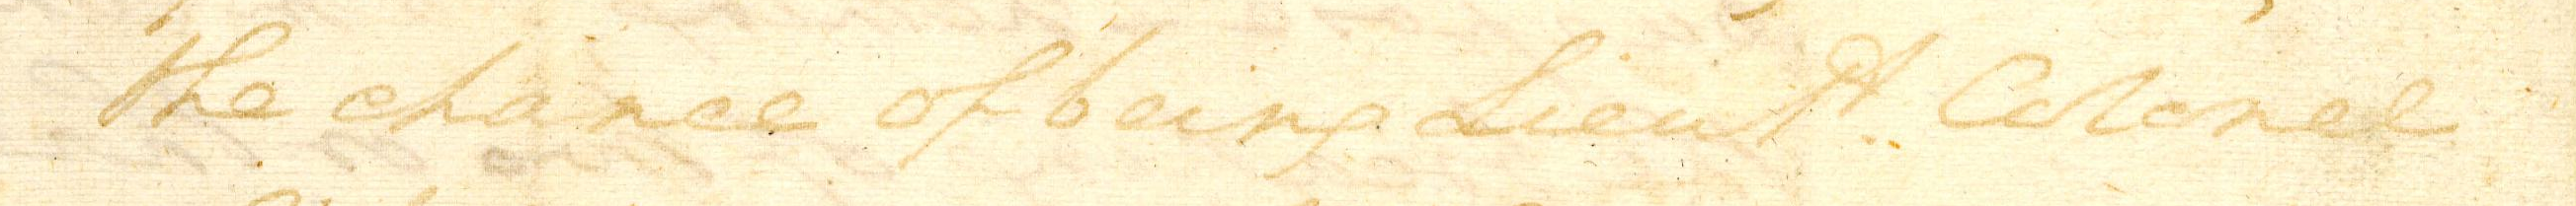the chance of being Lieut^t. Colonel
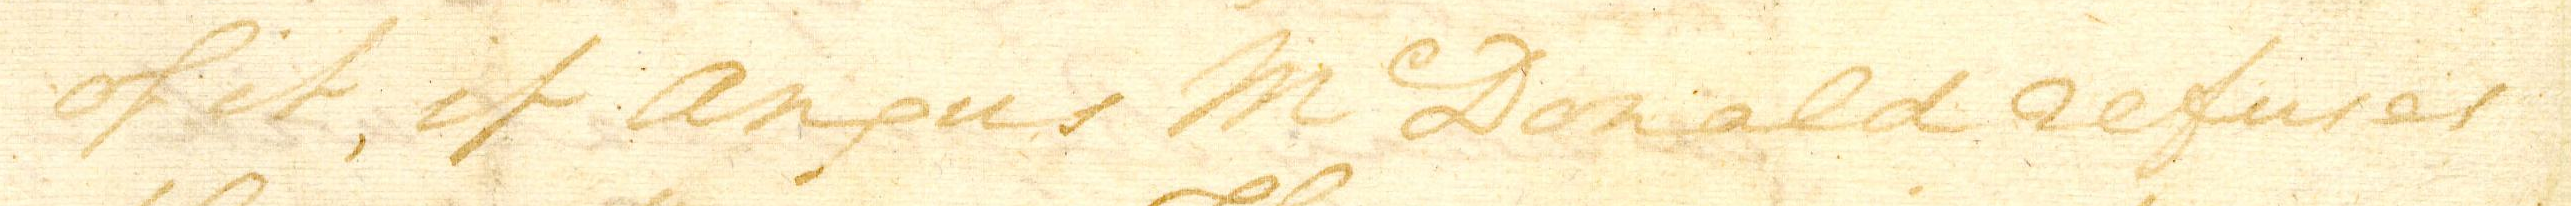of it, if Angus M^cDonald refuses
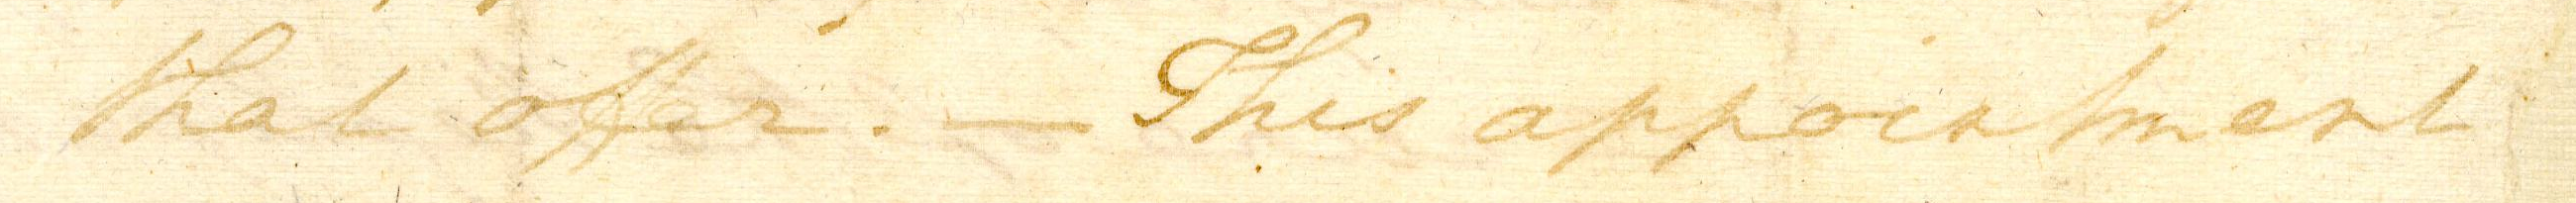that offer.- This appointment
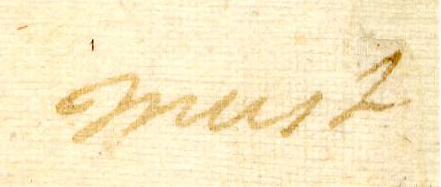must
